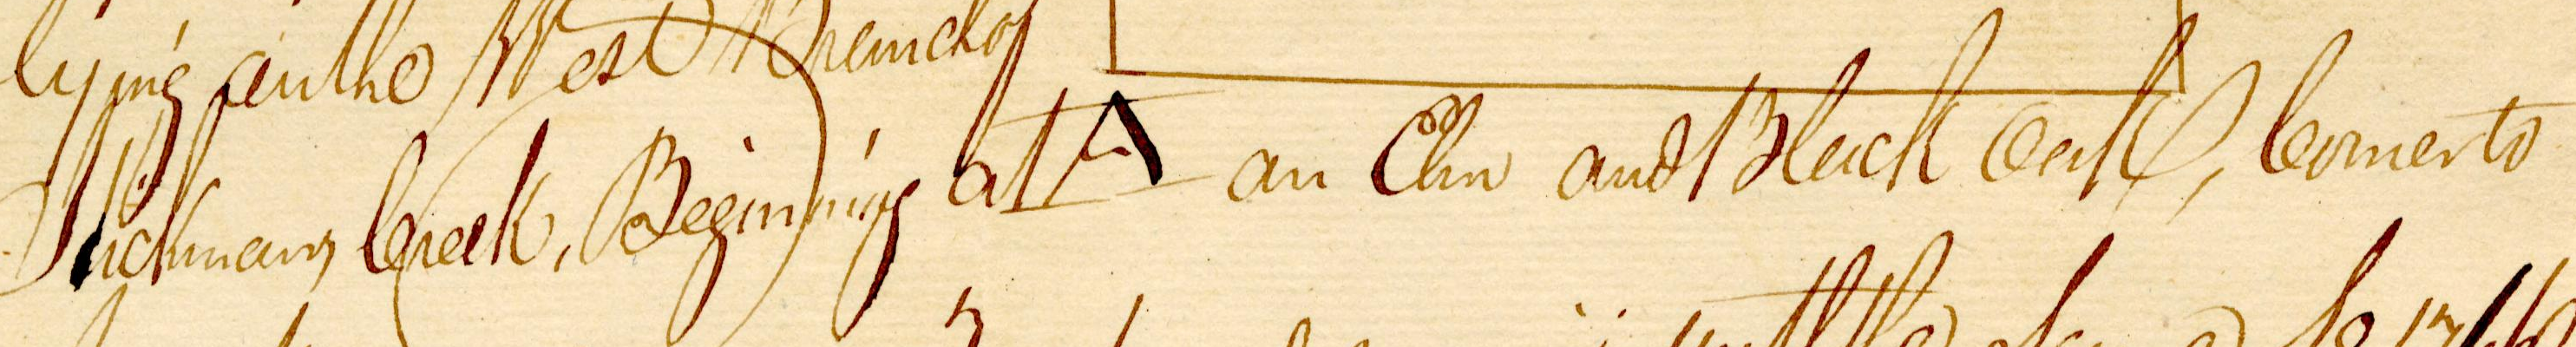Pickman's Creek, Beginning at A an end and shack Oak comes to
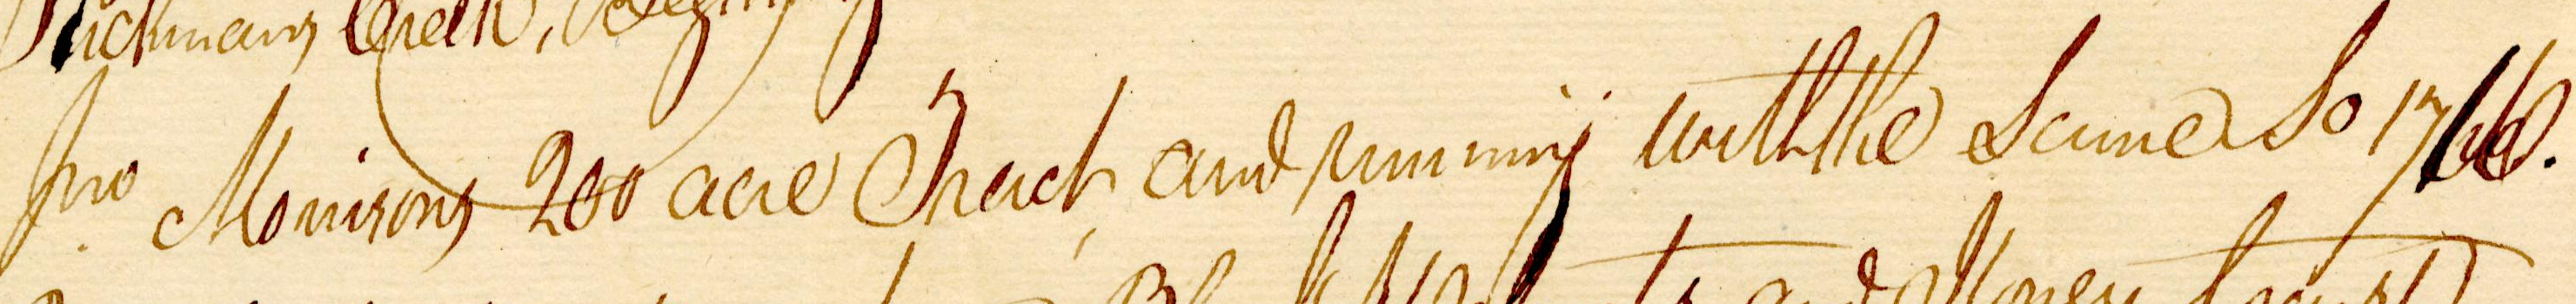Per Homings 200 acre Such and coming with the Same so 1766
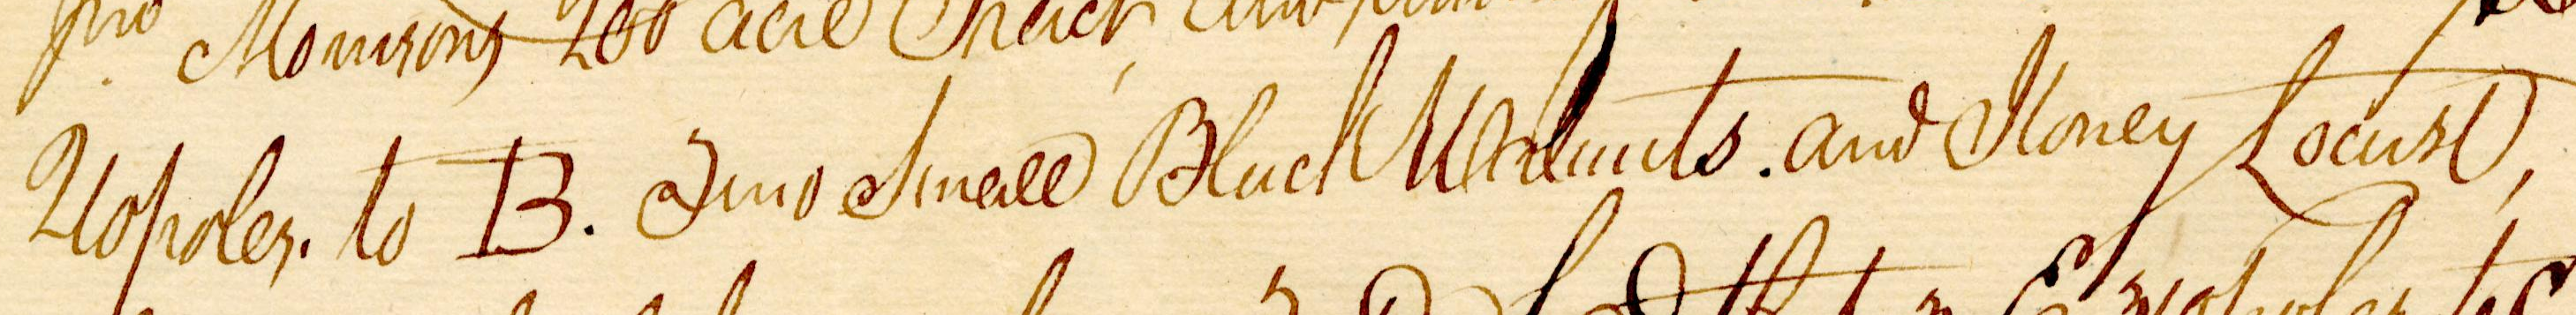26 poles to B. and Small Black walnuts. and Honey Locus
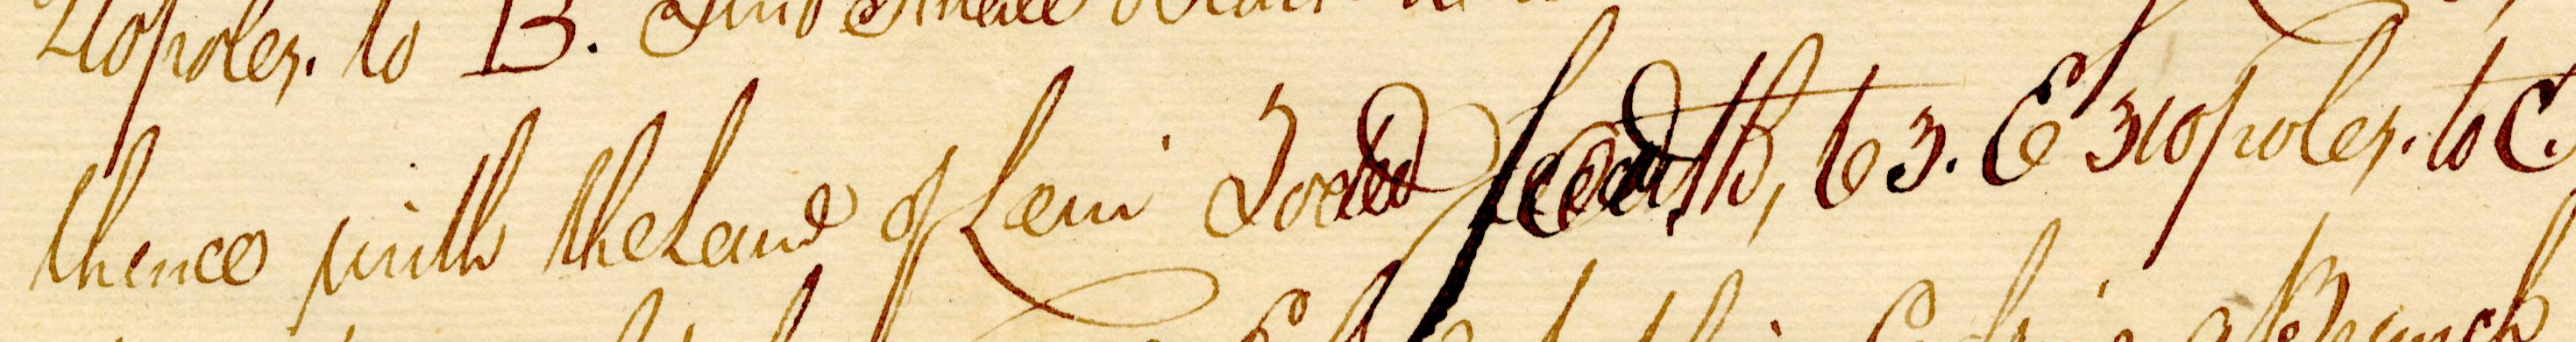chances with the house of lewis Jones [______], 63.6 poles to C.
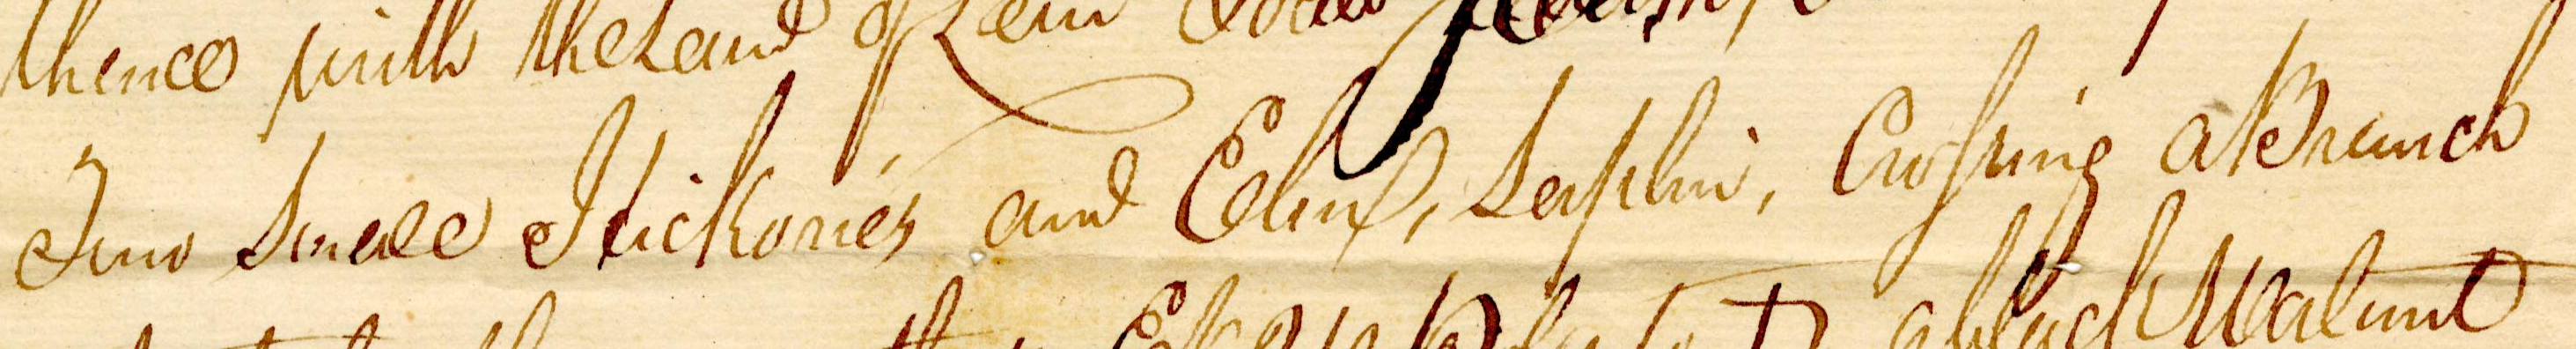Tens small Hickores and Elk, Saplings, Curling a branch
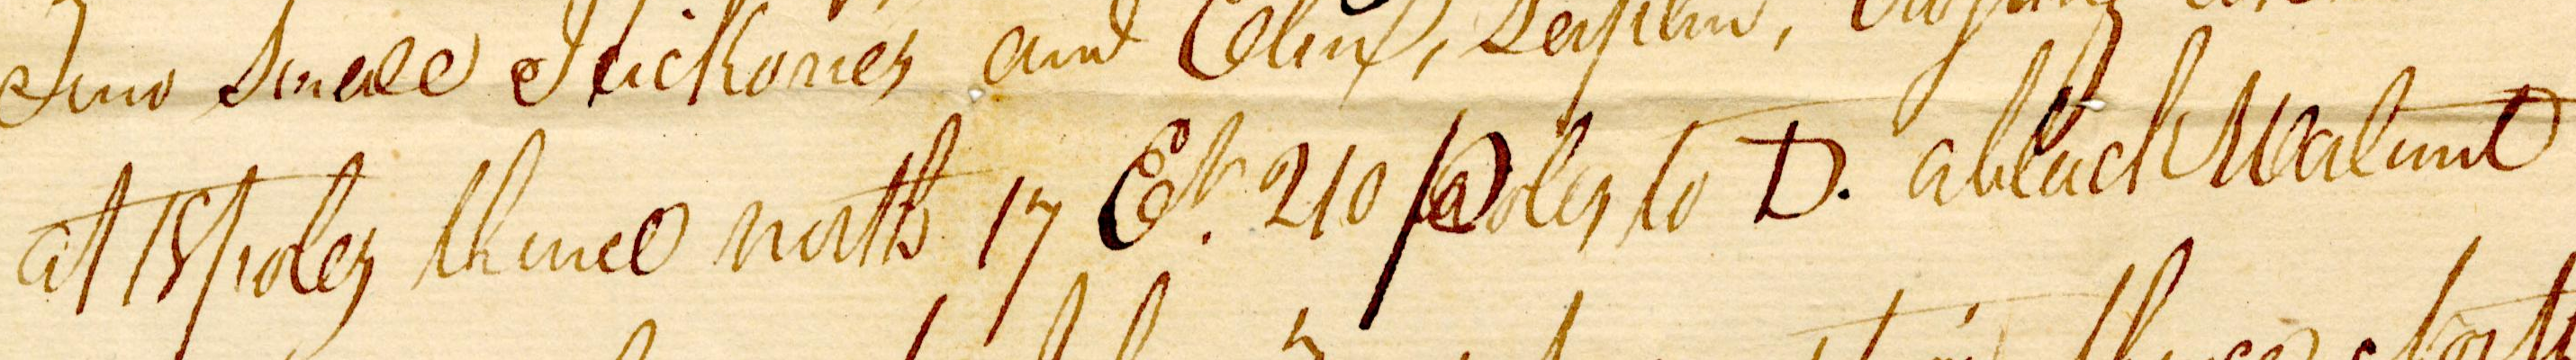A 18 poles shuned north 17 6^r. 210 Poles to D. a black Walnut
